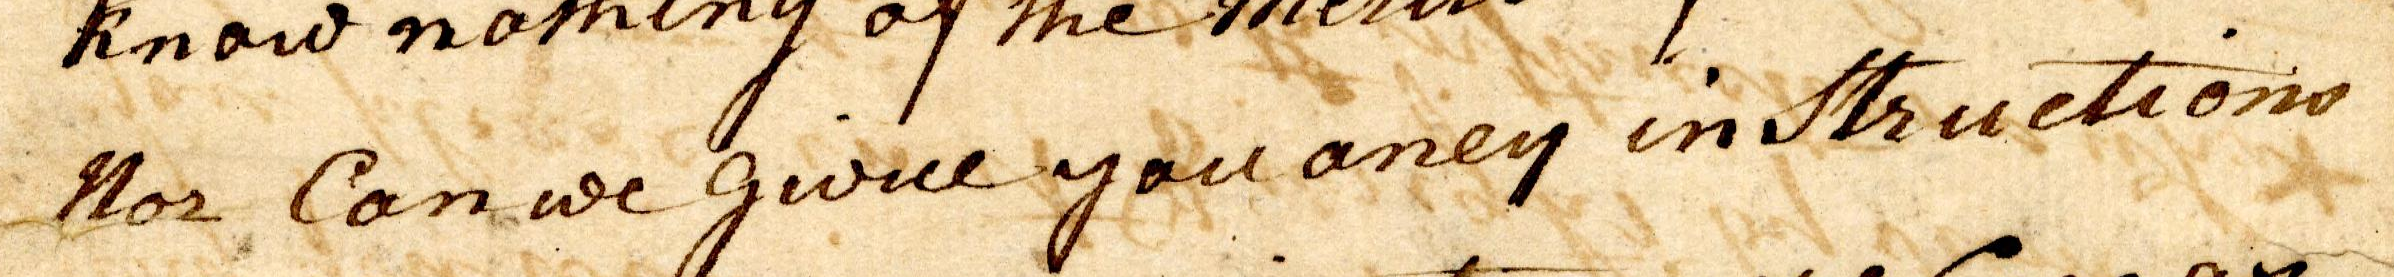nor Can we givie you aney instructions
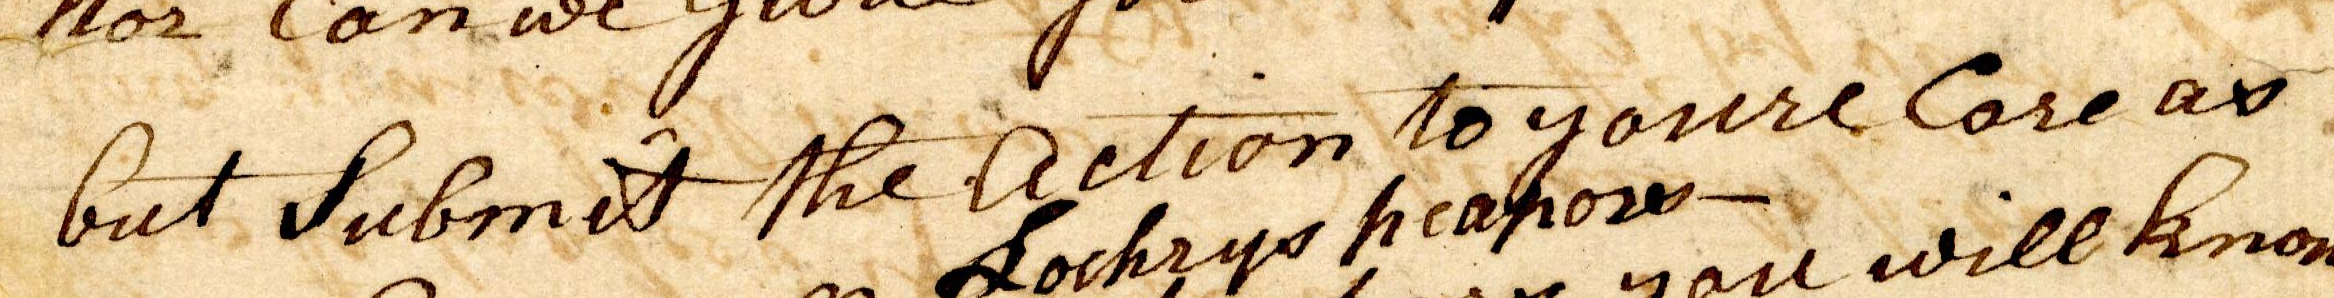but Submit the Action to youre Care as
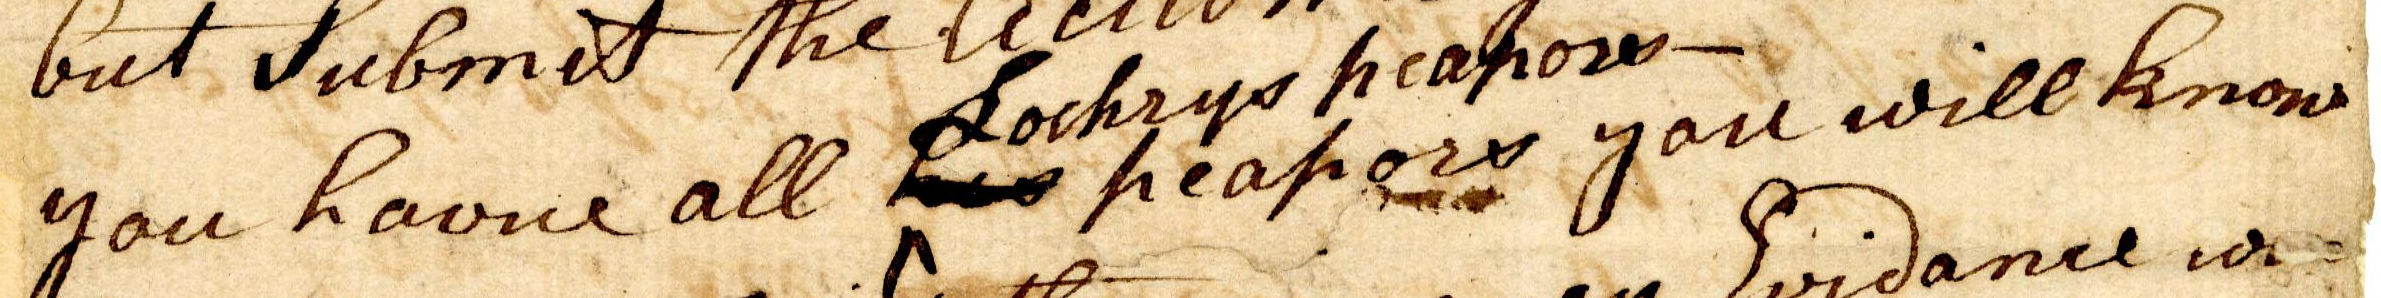you havue all his ^ peapors you will know
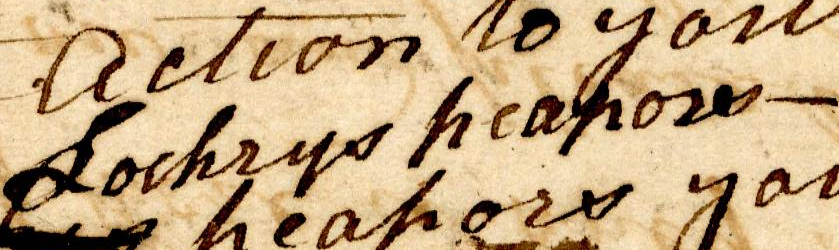Lochrys peapors
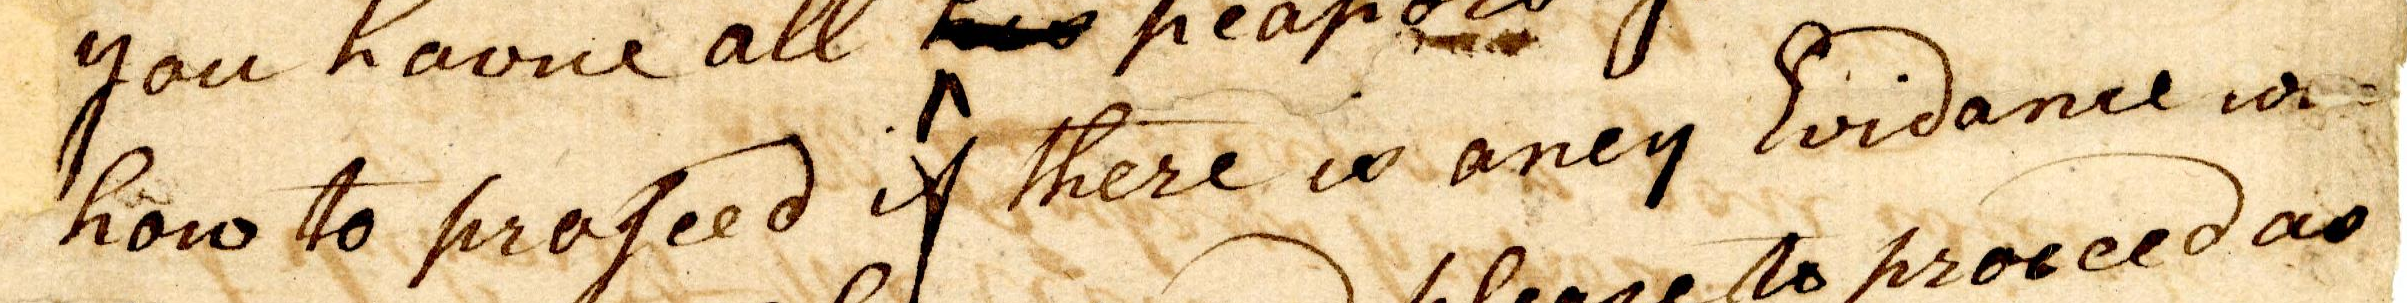how to proseed if there is aney Evidance [__]-
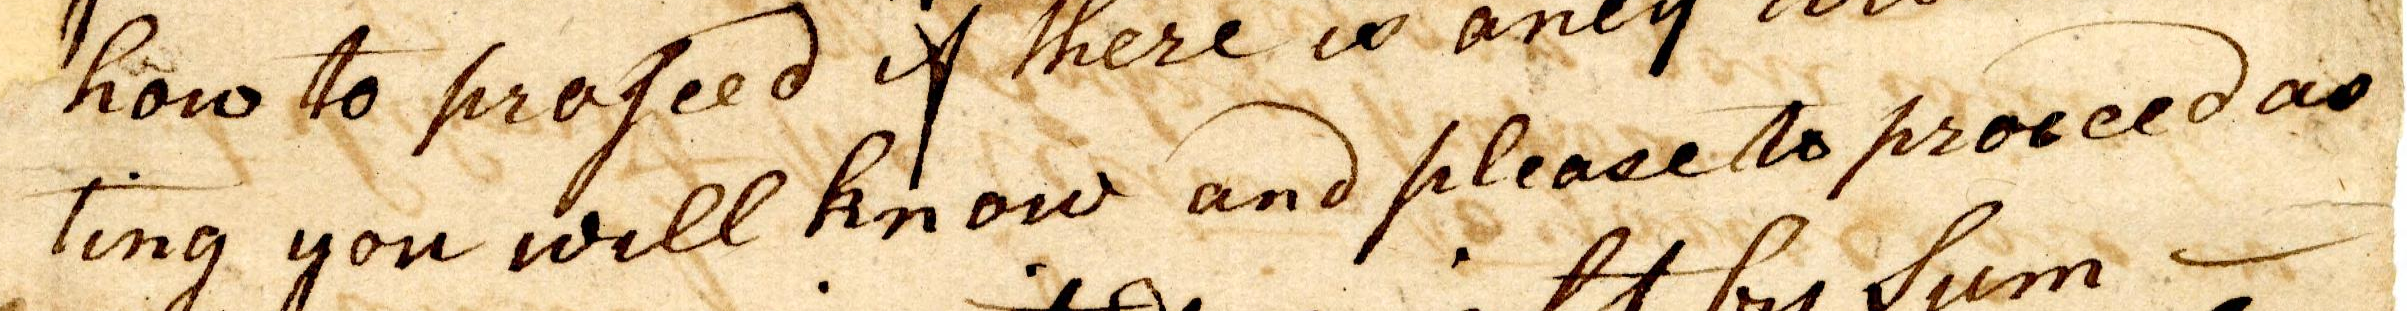-ting you will know and please to proceed as
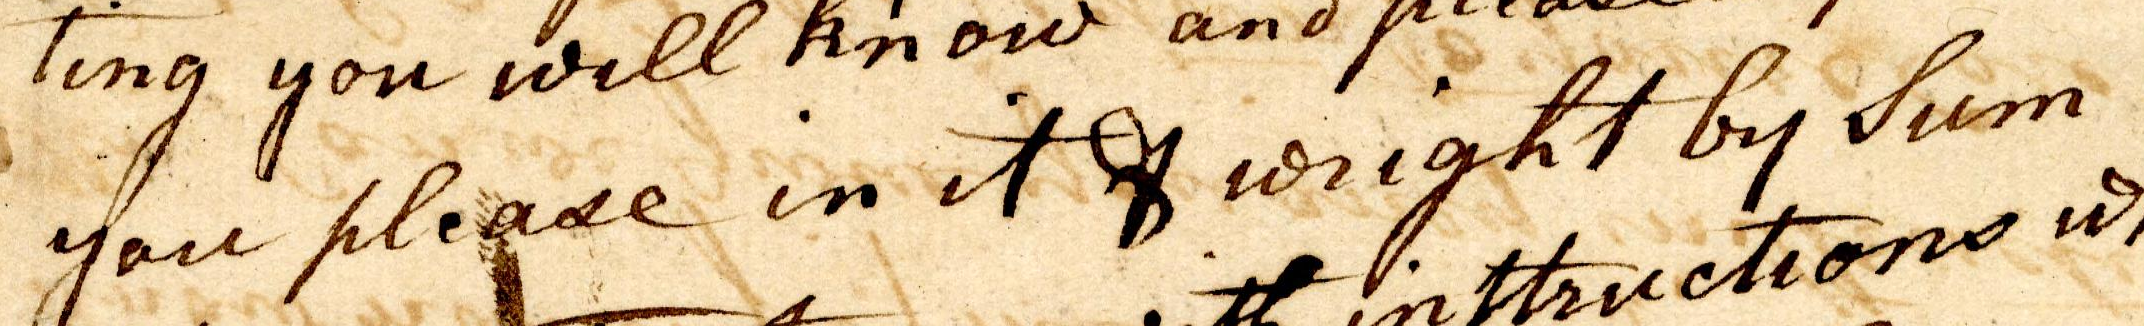you please in it & wright by Sum
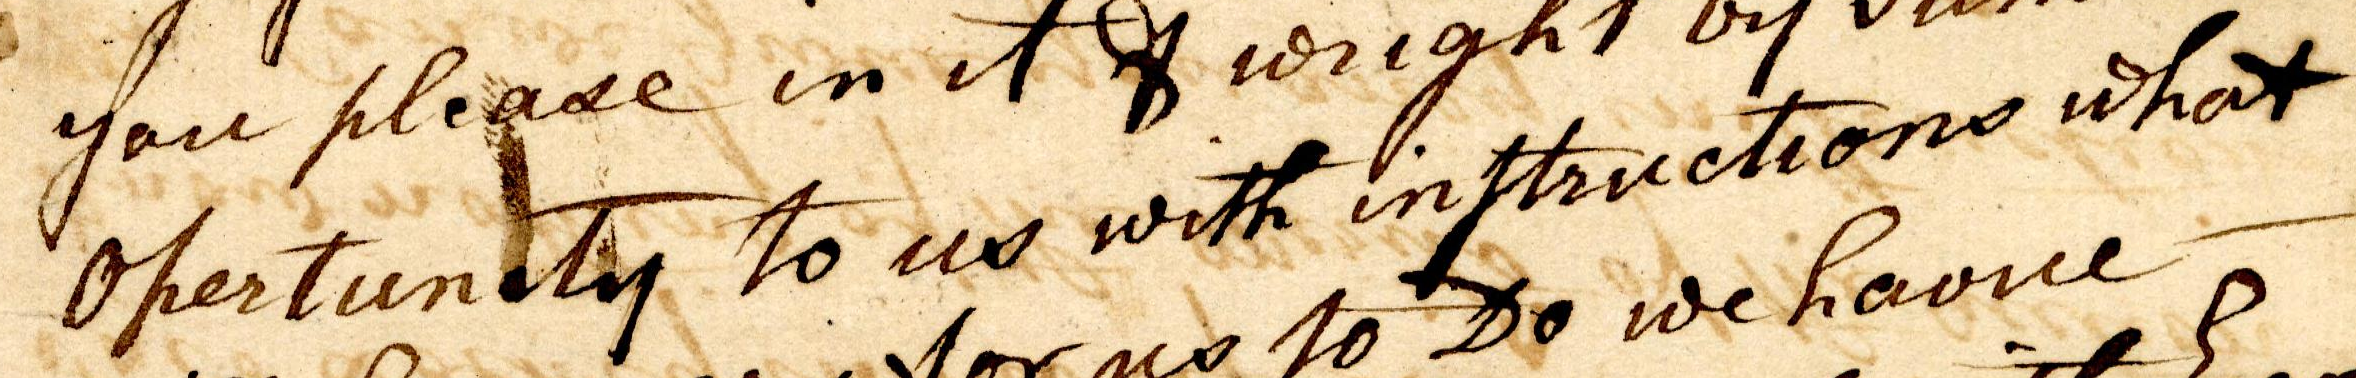Opertunity to us with instructions what
